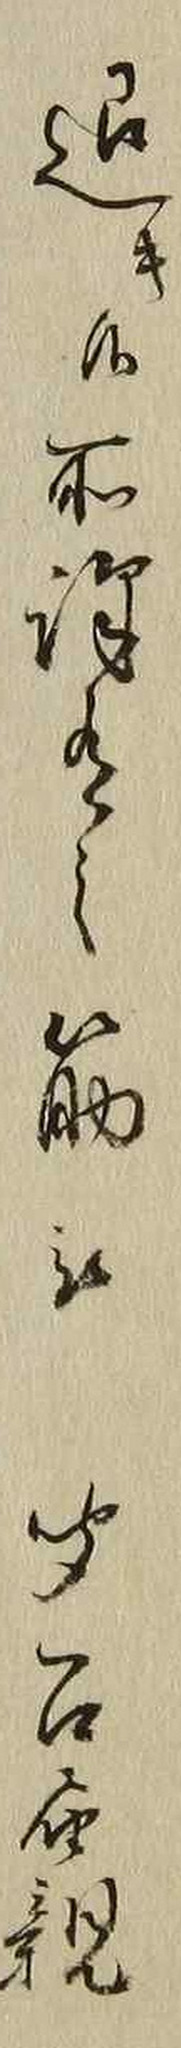退キ候所訳有之筋被聞召届親
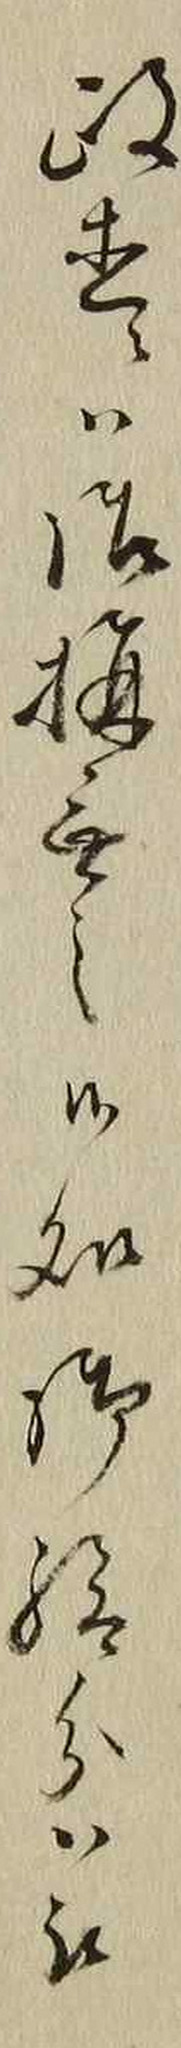政直ニハ御構無之候処御給分ハ被
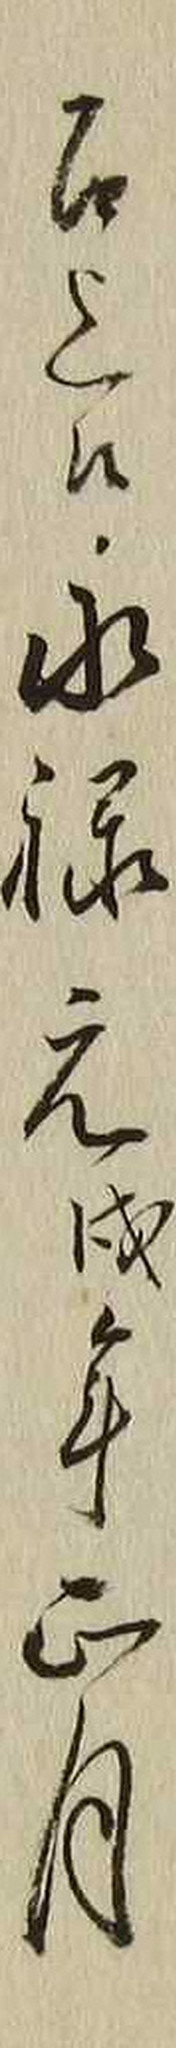召上候永禄元戌年正月
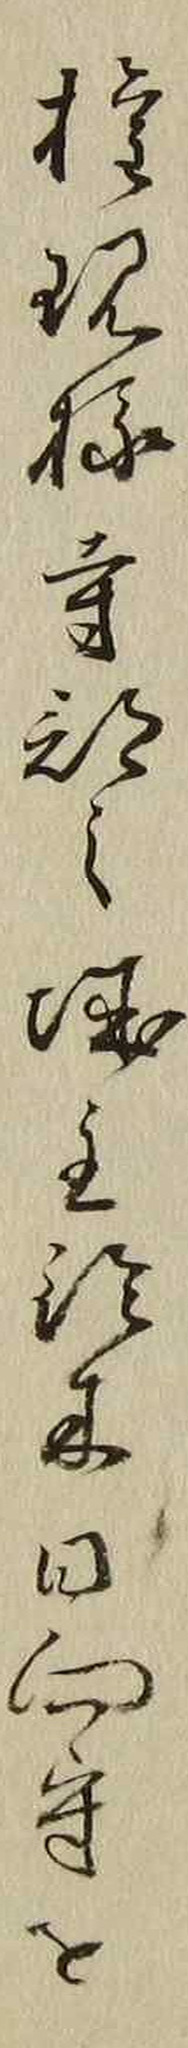権現様寺部之城主鈴木日向守を
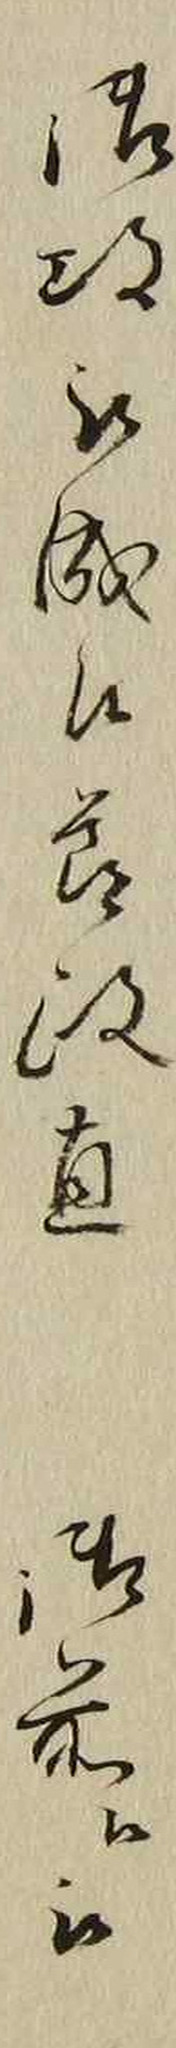御攻被成候節政直御前江被
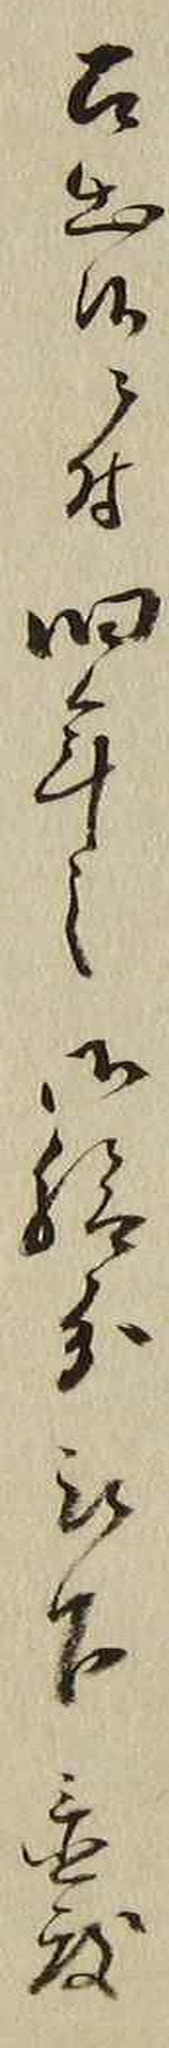召出候ニ付旧年之御給分被下置度
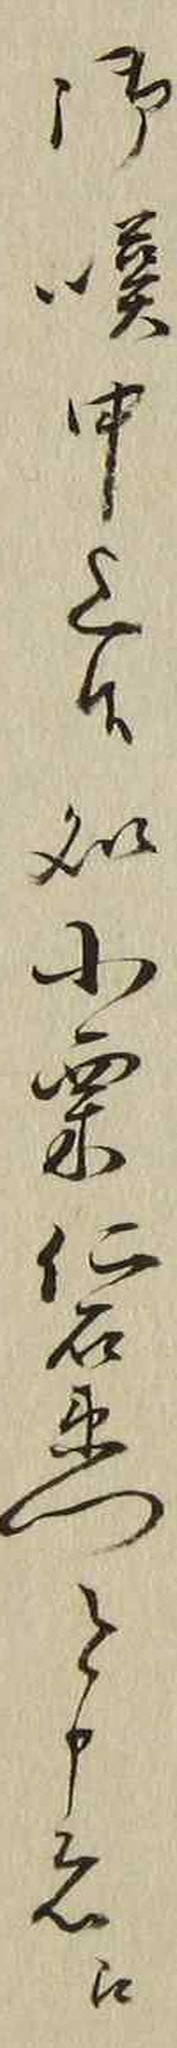御嘆申上候処小栗仁右衛門と申者江
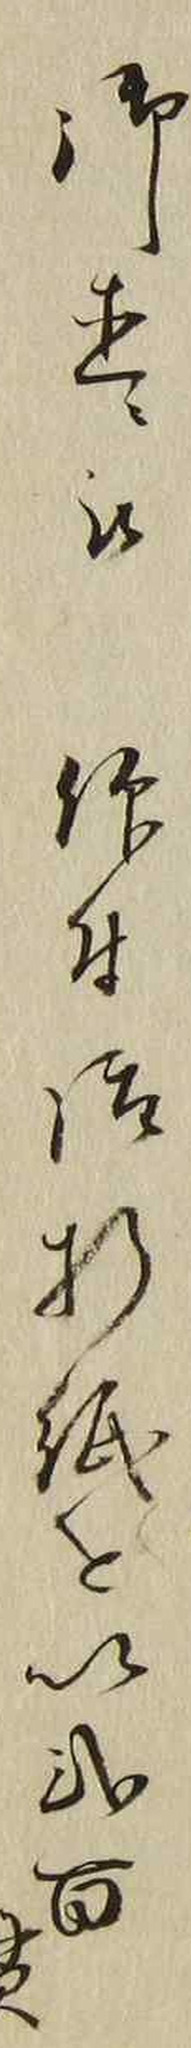御直ニ被仰付御折紙を以弐百貫
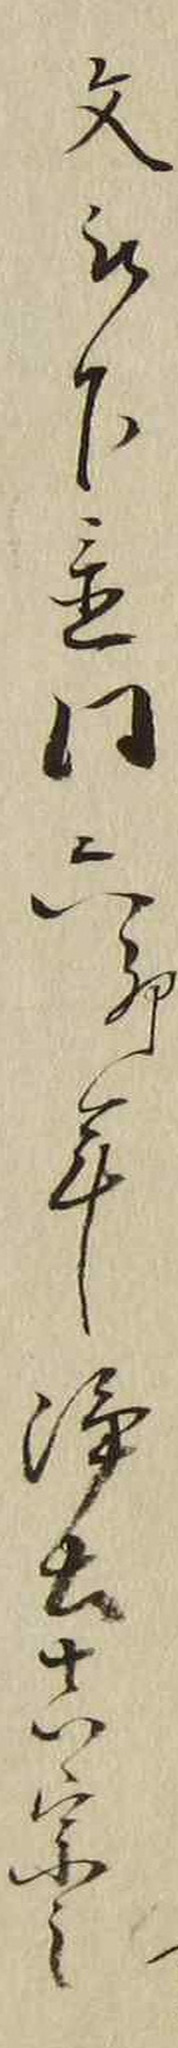文被下置同六卯年浄土真宗之
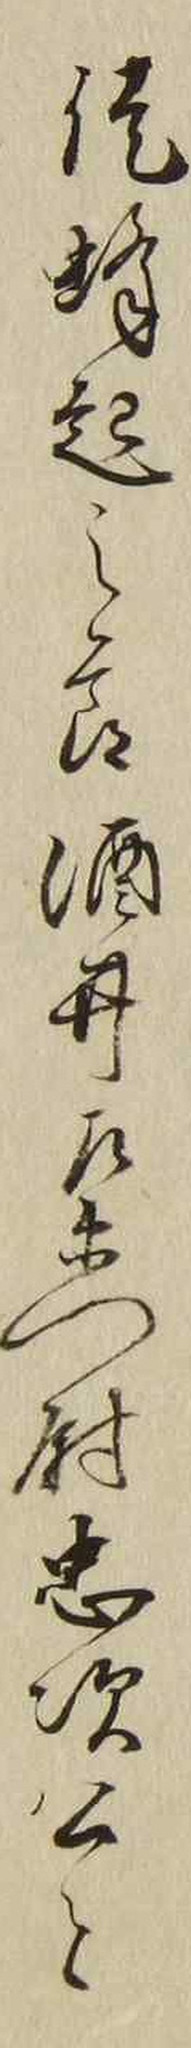徒蜂起之節酒井左衛門尉忠次公と

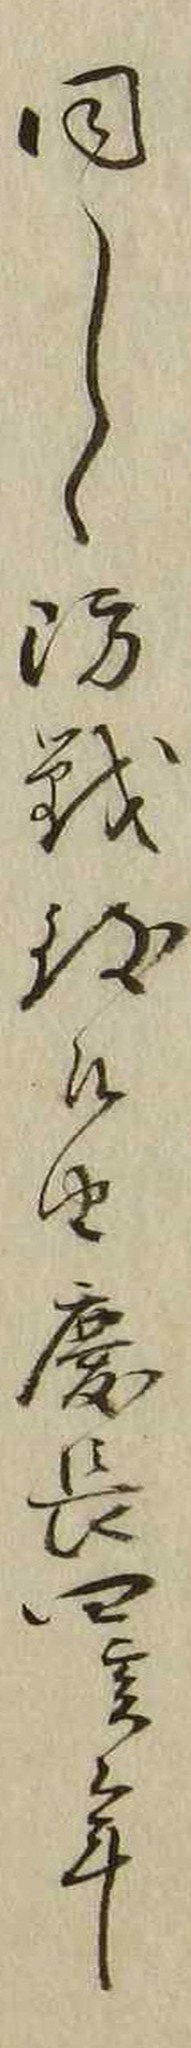同しく防戦致候由慶長四亥年
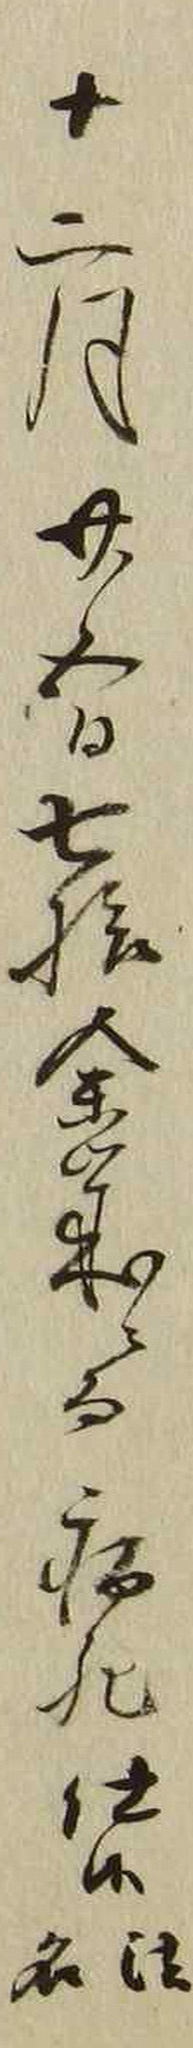十二月廿五日七拾余歳ニ而病死仕候法名
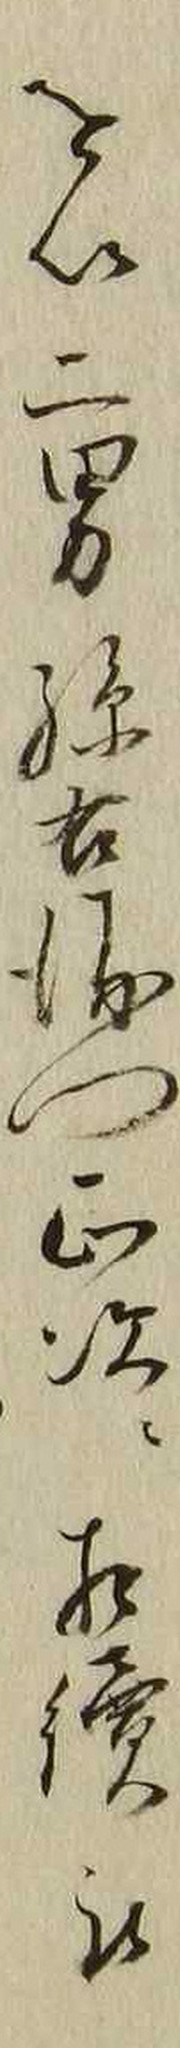を以二男孫右衛門正次ニ相続被
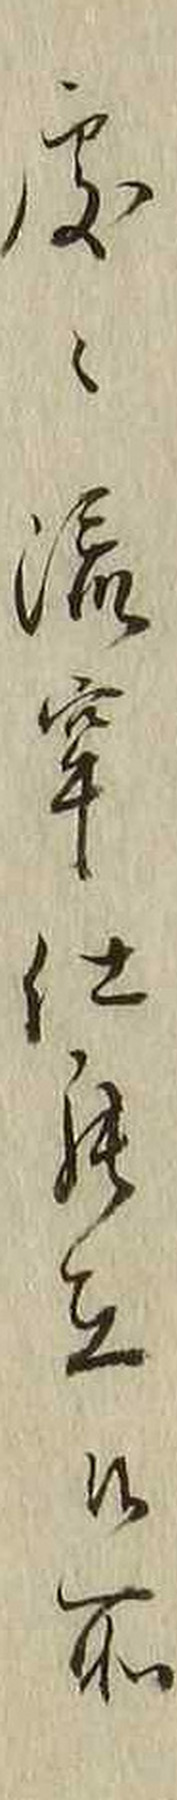処々流牢仕罷在候所
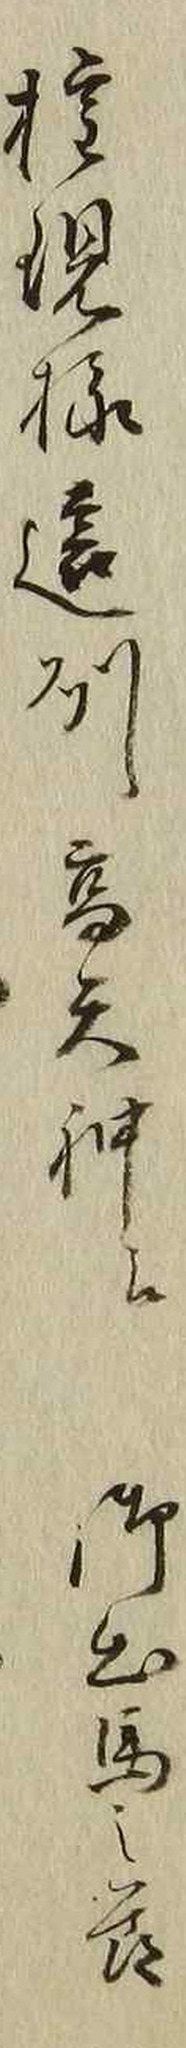権現様遠州高天神江御出馬之節
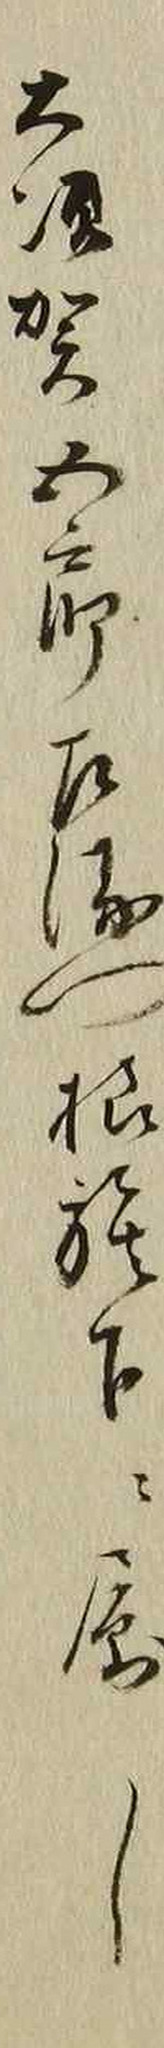大須賀五郎左衛門様旗下ニ属し
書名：諸士系譜　巻之68　を之部2
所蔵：会津若松市立会津図書館
